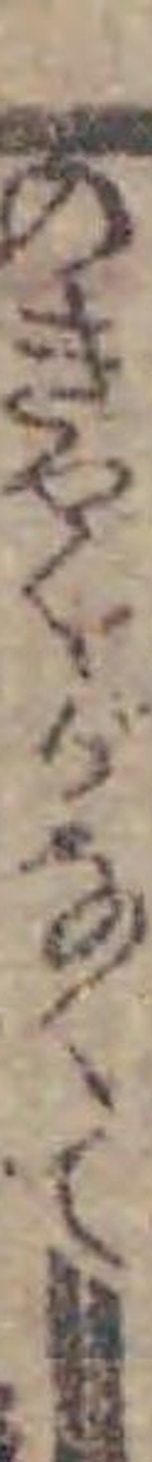のきやくがなくて
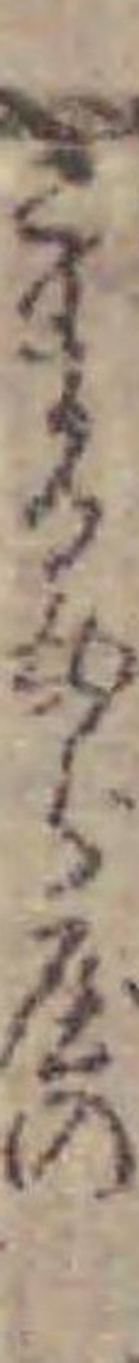こまる女郎屋の
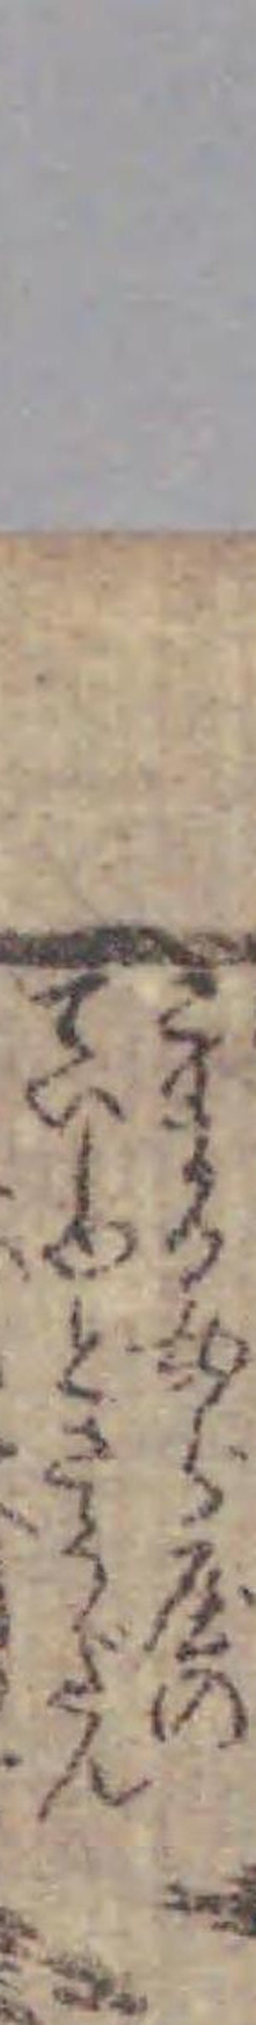ていしゆとさうだん
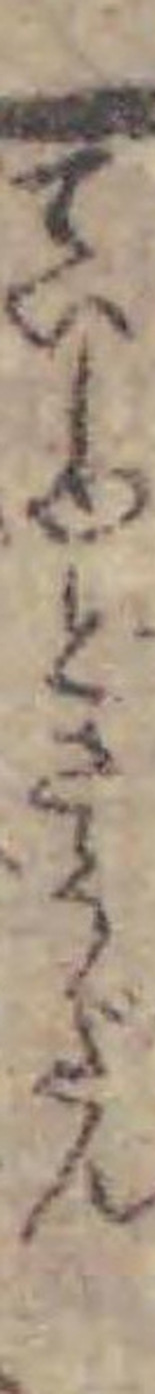ていしゆとさうだん
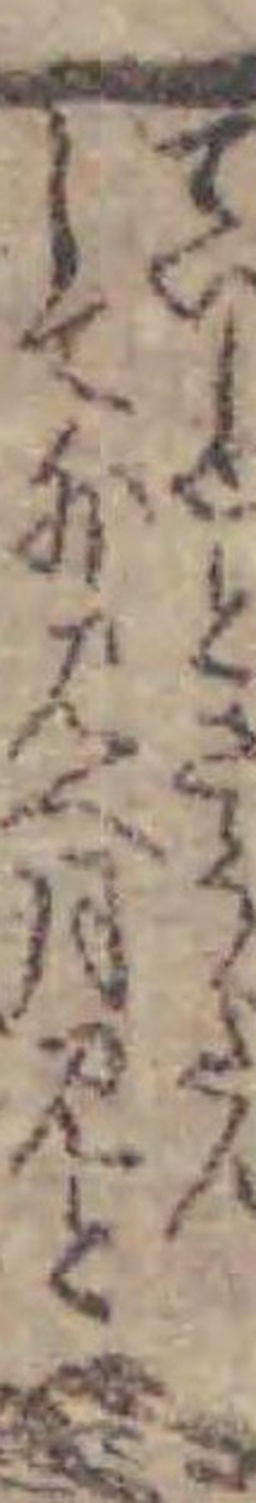して外見へ月見と
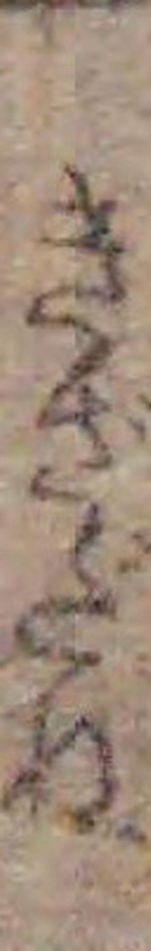きざだね
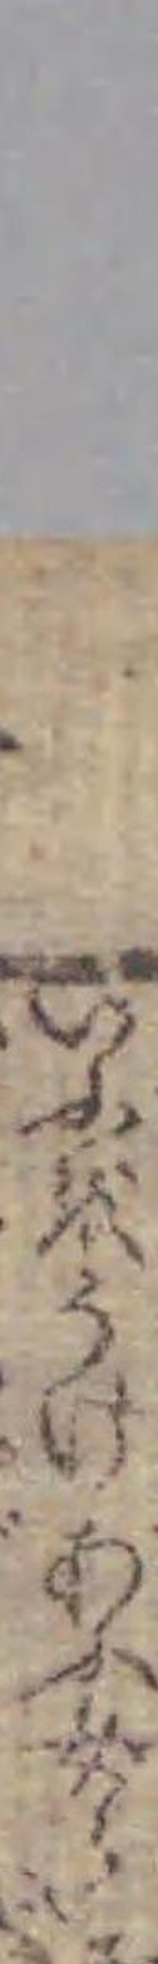いふをうけあふ女郎
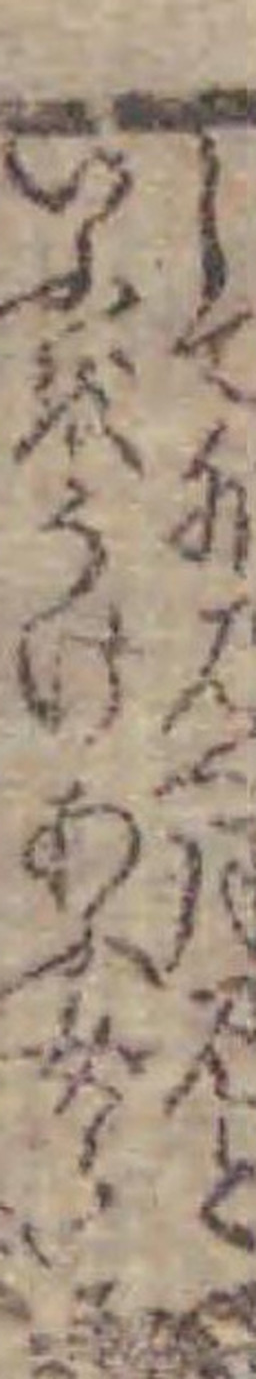いふをうけあふ女郎
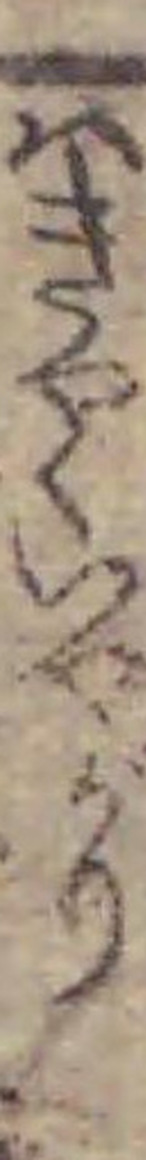はきやくいやがり
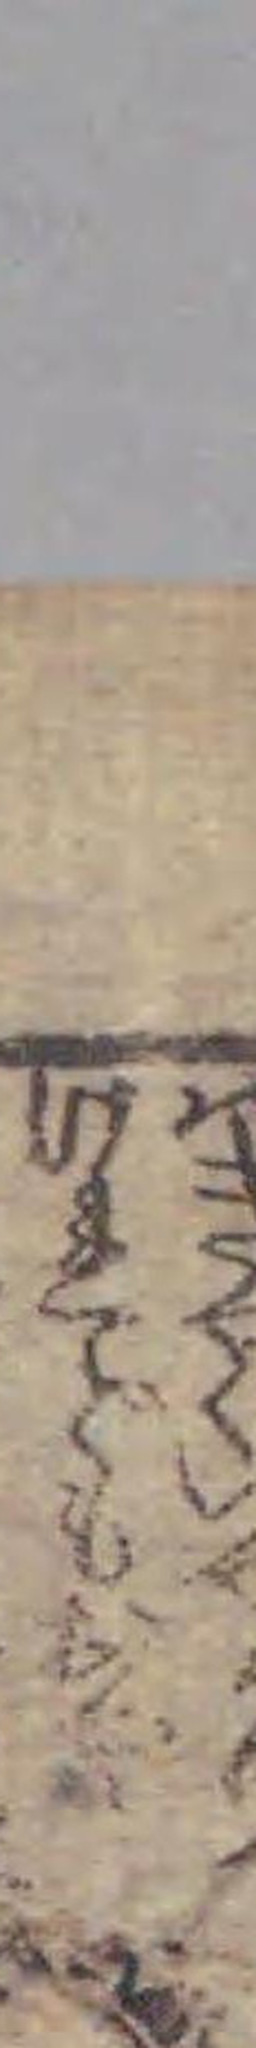けれどもおや
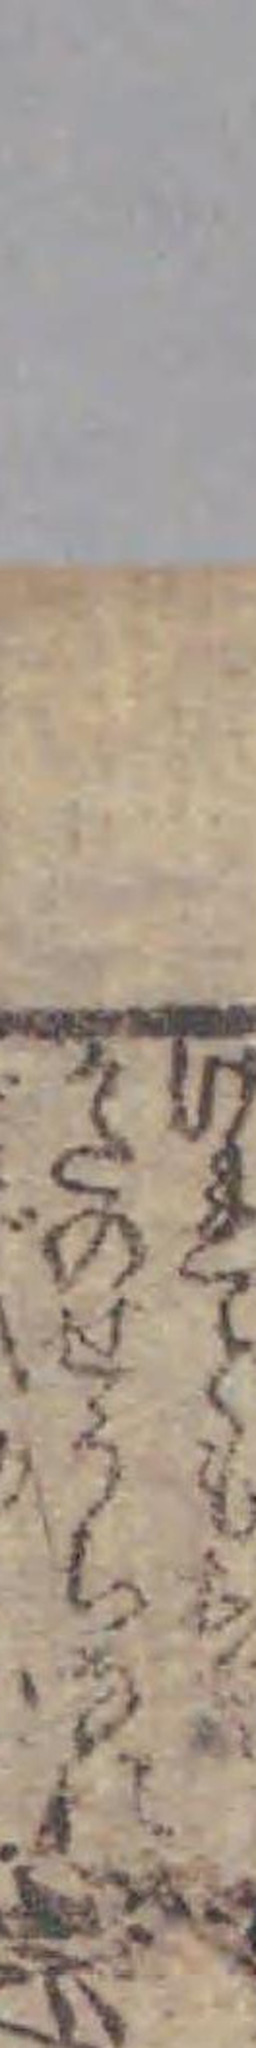かたのせうちなれ
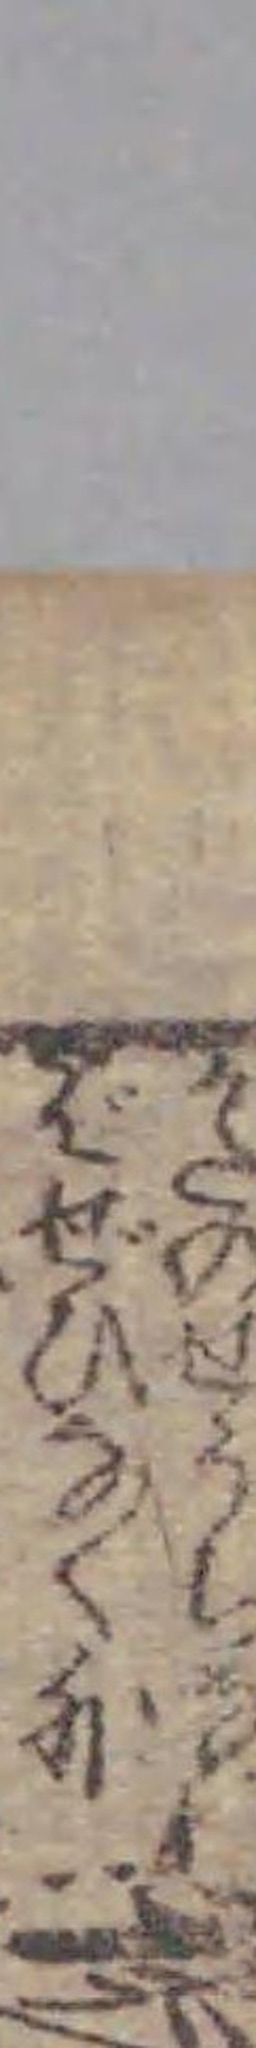ばぜひなく外
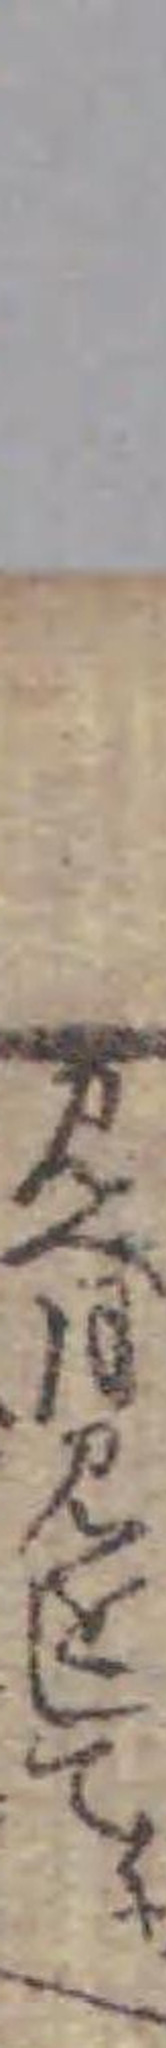見へ月見をして
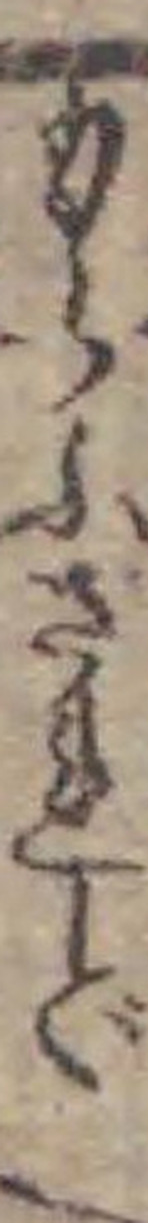もらふされど
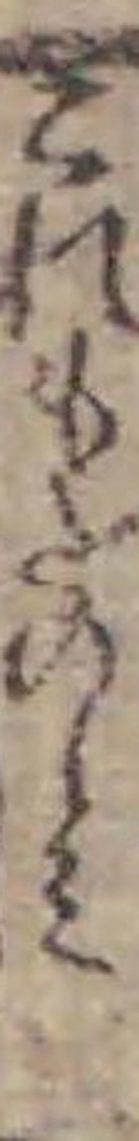これもたのしみし
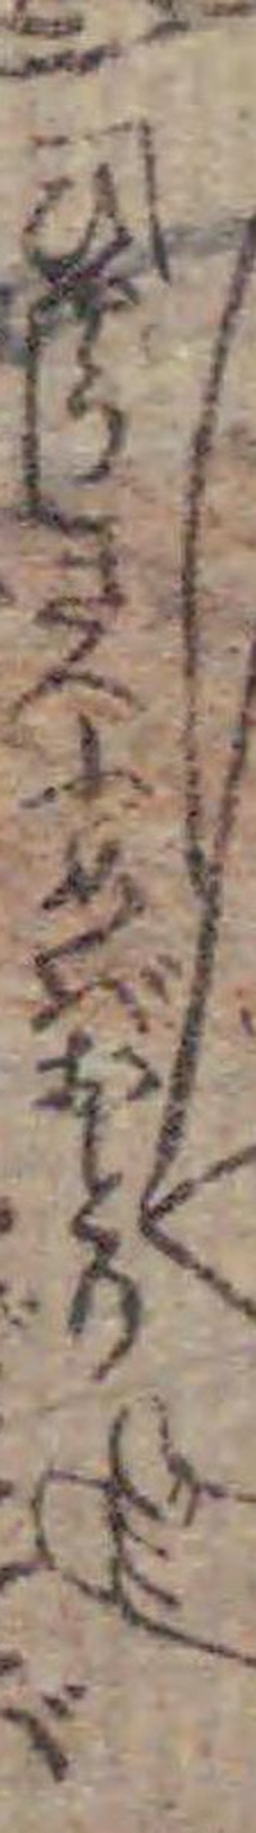〽ひやうしさへふめばおとり
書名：本樹真猿浮気噺 : 3巻
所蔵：国立国会図書館 National Diet Library, JAPAN
